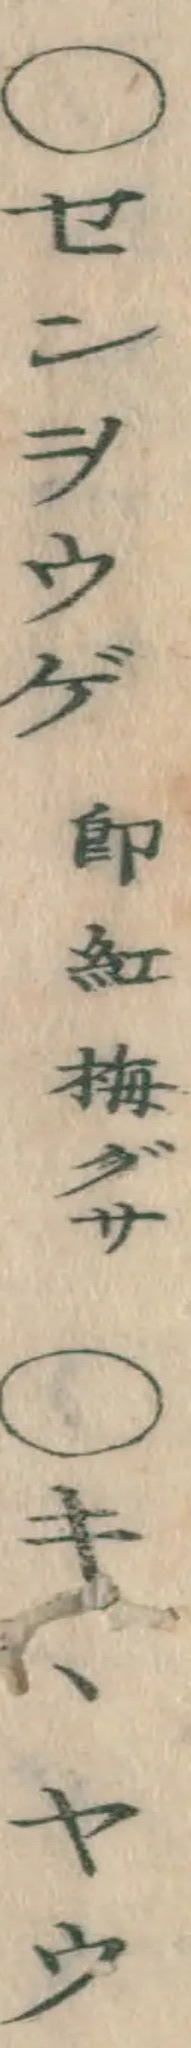○センヲウゲ即紅梅グサ○キヽヤウ
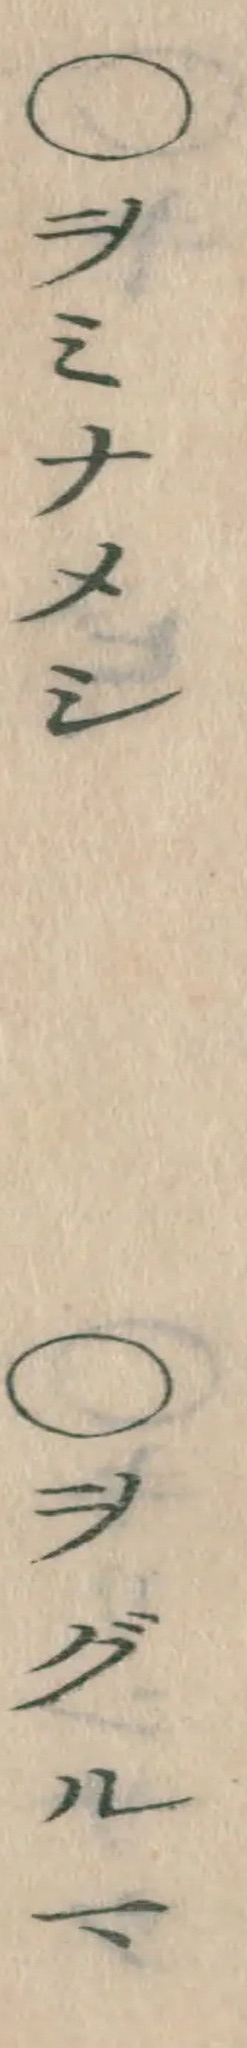○ヲミナメシ○ヲグルマ
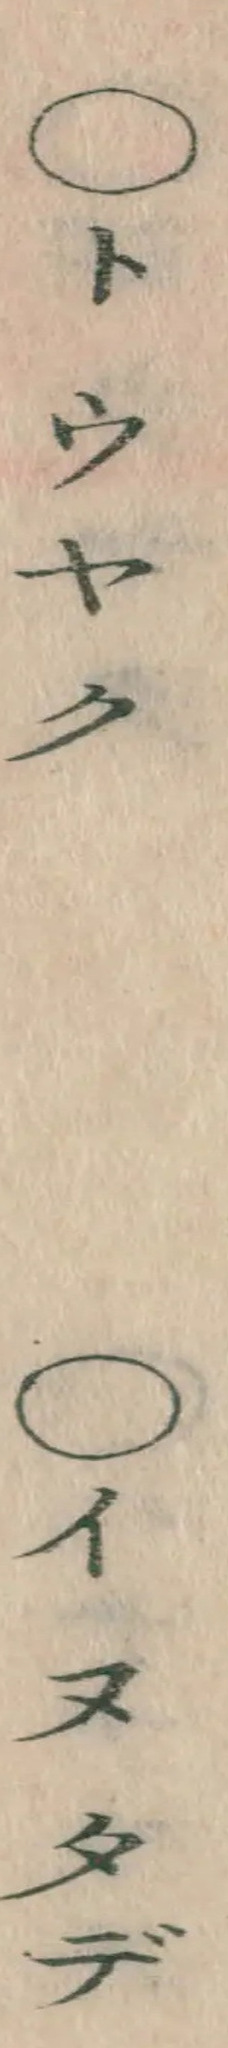○トウヤク○イヌタデ
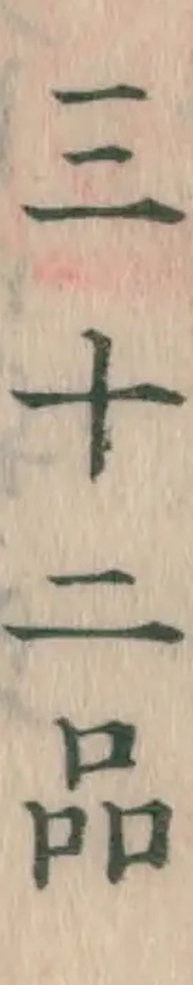三十二品

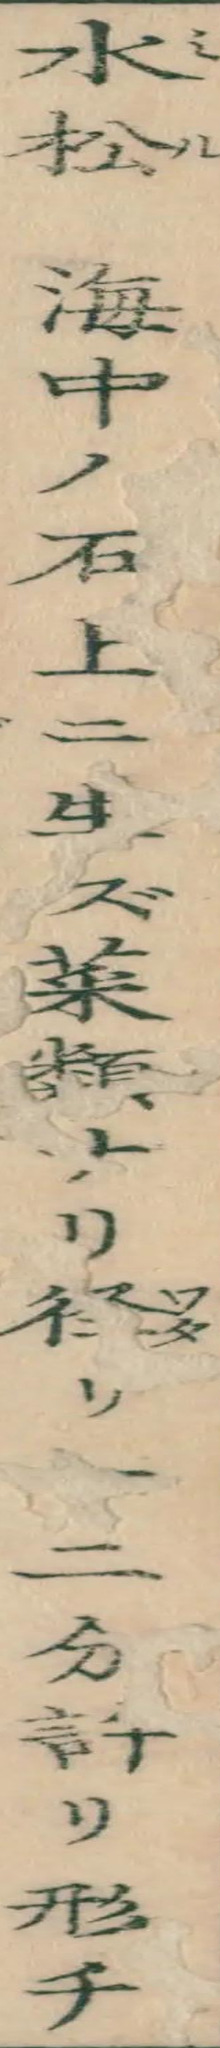水松海中ノ石上ニ生ズ菜類ナリ径リ二分許リ形チ
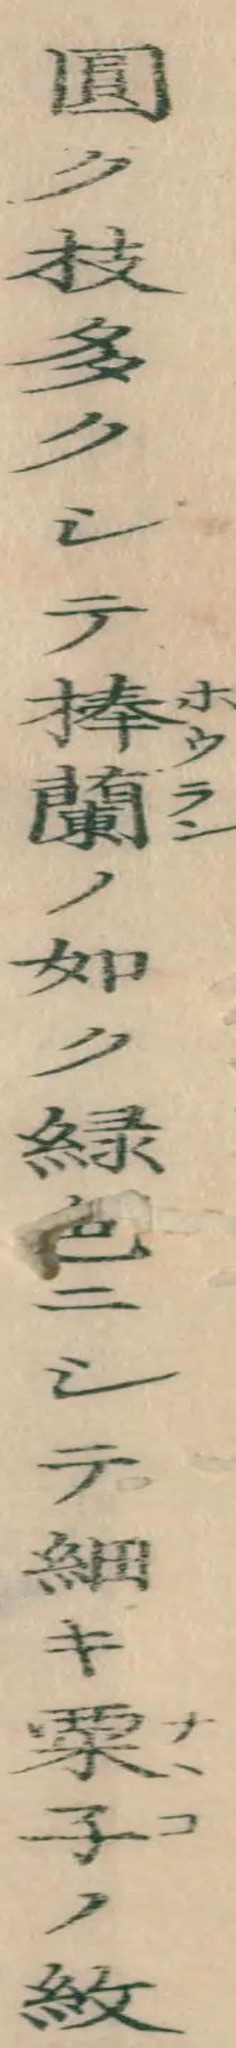円ク枝多クシテ棒蘭ノ如ク緑色ニシテ細キ粟子ノ紋
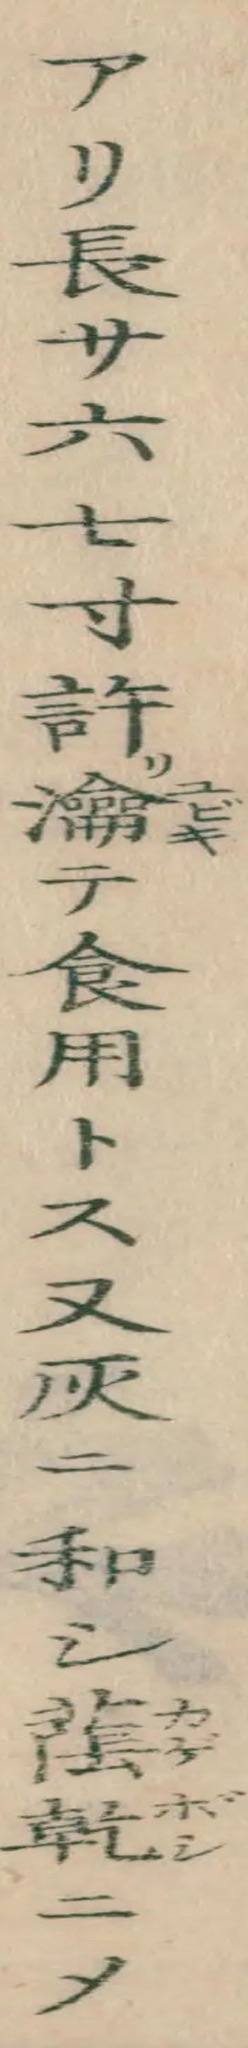アリ長サ六七寸許瀹テ食用トス又灰ニ和シ蔭乾ニシテ
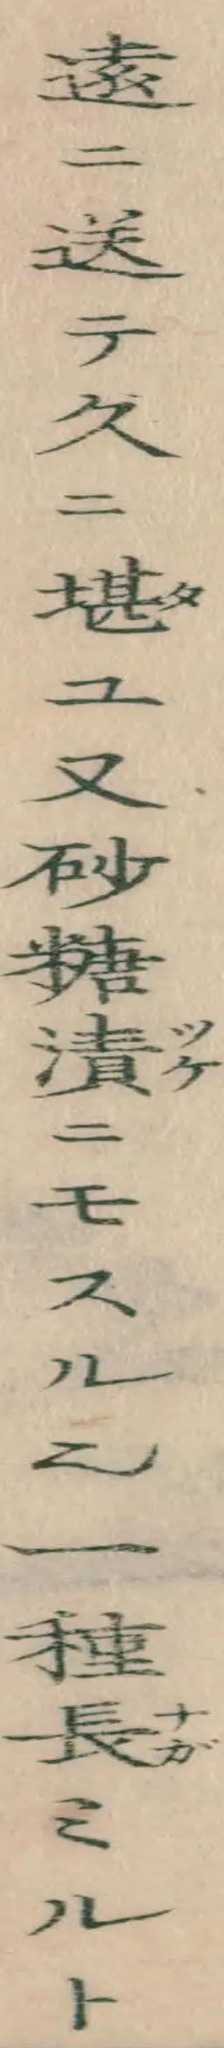遠ニ送テ久ニ堪ユ又砂糖漬ニモスル也一種長ミルト
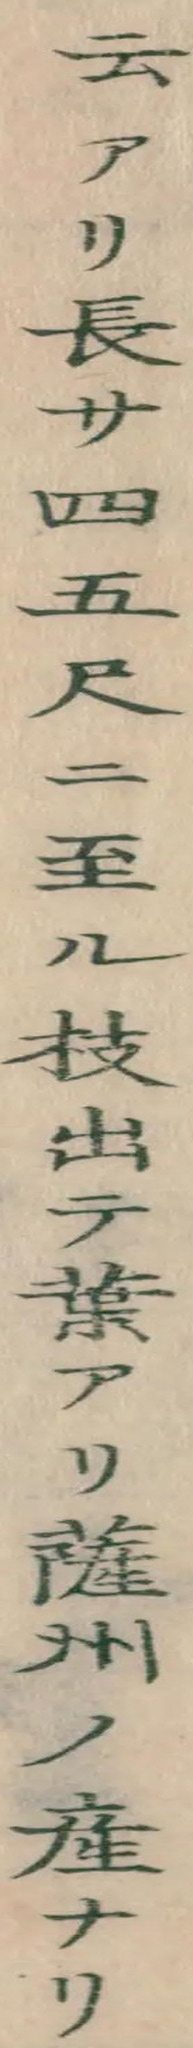云アリ長サ四五尺ニ至ル枝出テ葉アリ薩州ノ産ナリ
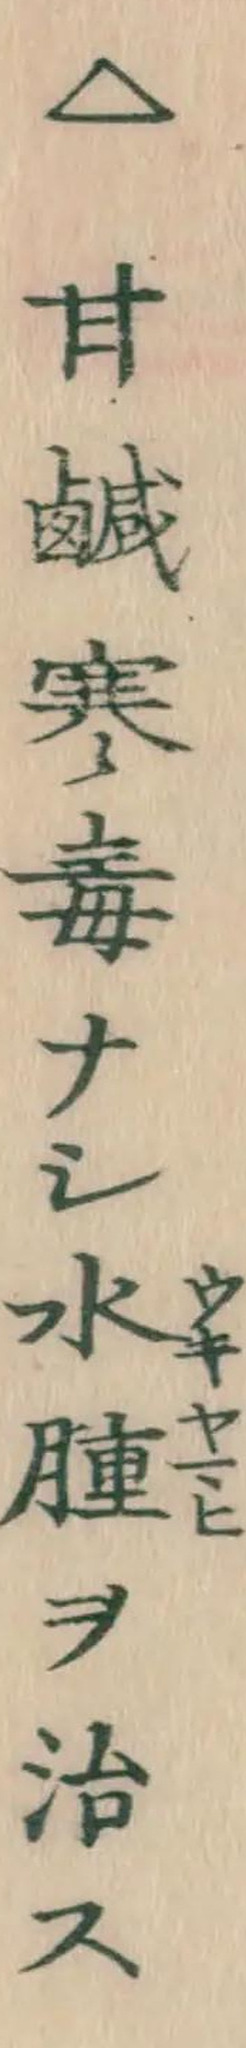△甘鹹寒毒ナシ水腫ヲ治ス

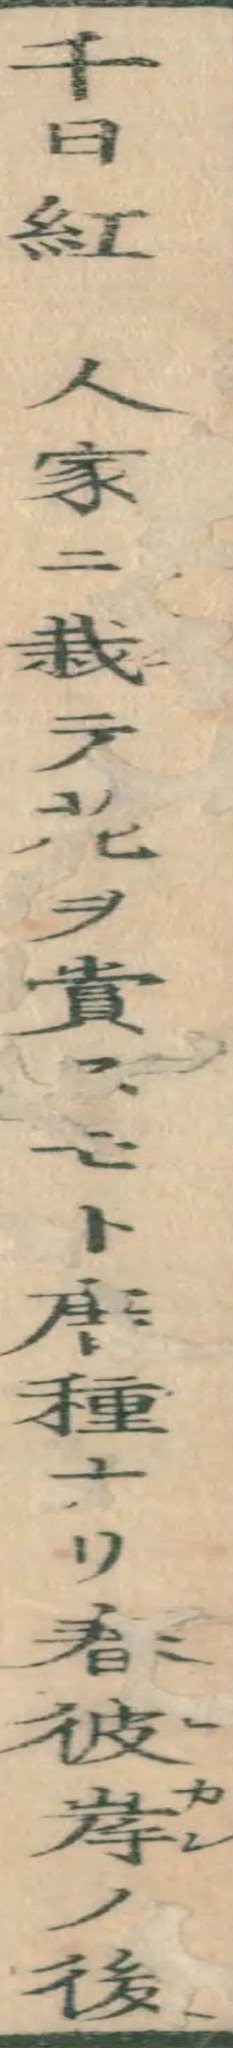千日紅人家ニ栽テ花ヲ賞スモト種ナリ春彼岸ノ後
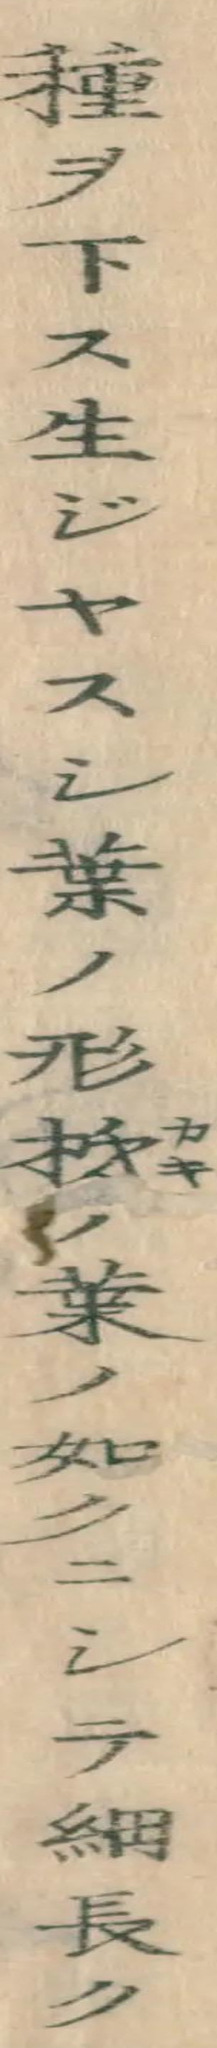種ヲ下ス生ジヤスシ葉ノ形柿ノ葉ノ如クニシテ細長ク
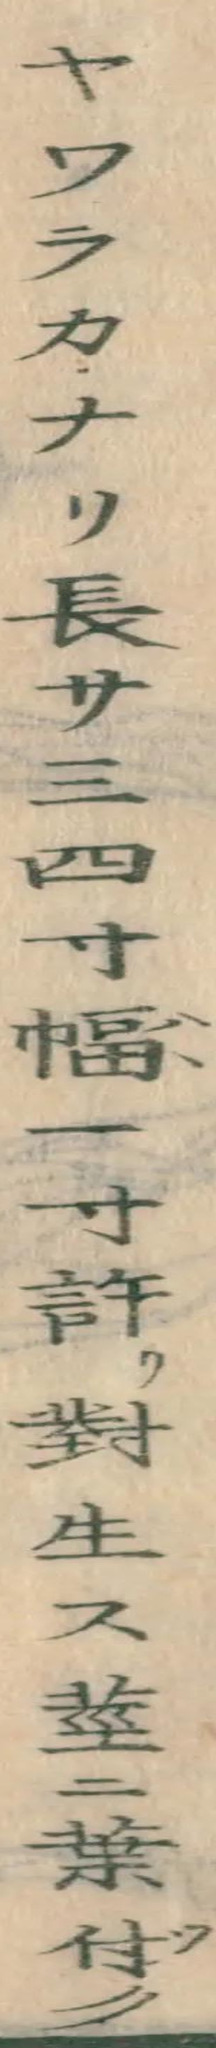ヤワラカナリ長サ三四寸幅一寸許対生ス茎ニ葉付ク
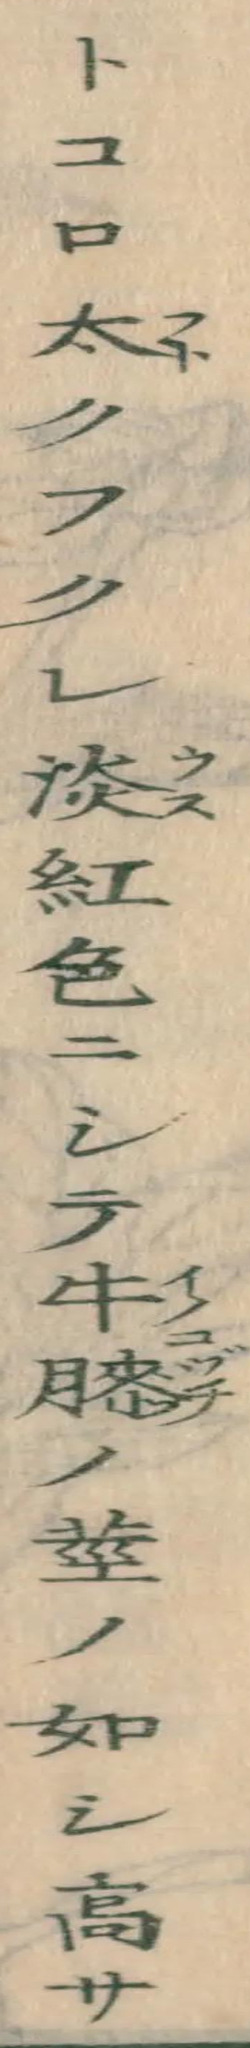トコロ太クフクレ淡紅色ニシテ牛膝ノ茎ノ如シ高サ
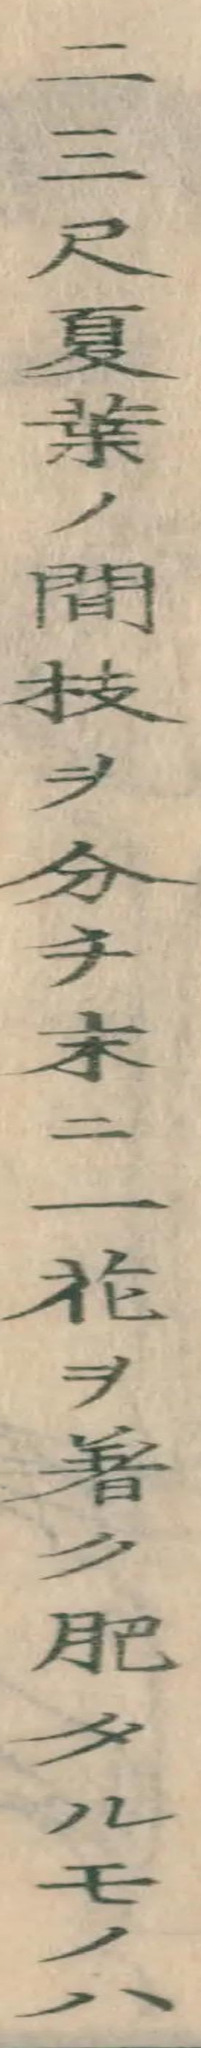二三尺夏葉ノ間枝ヲ分チ末ニ一花ヲ着ク肥タルモノハ
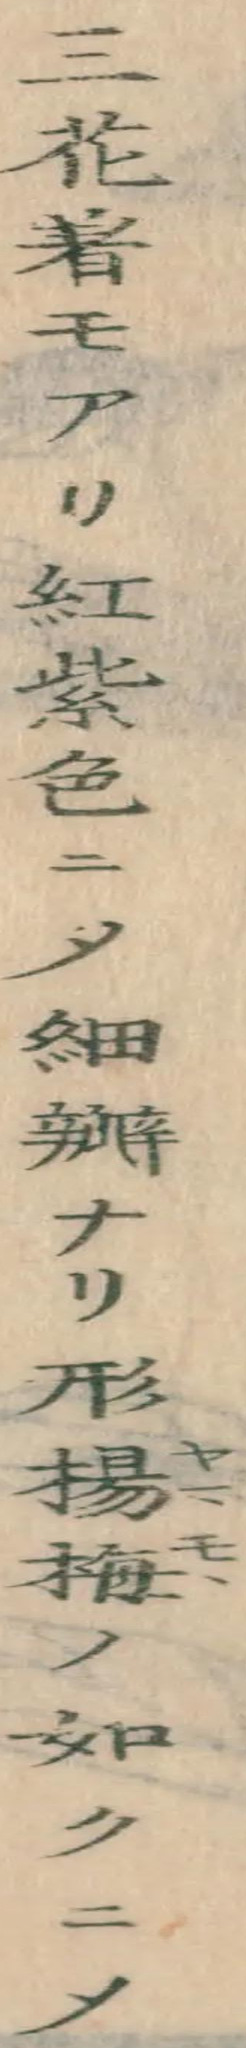三花着モアリ紅紫色ニシテ細弁ナリ形楊梅ノ如クニシテ
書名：これこれ草 2巻. [2]
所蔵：国立国会図書館 National Diet Library, JAPAN
